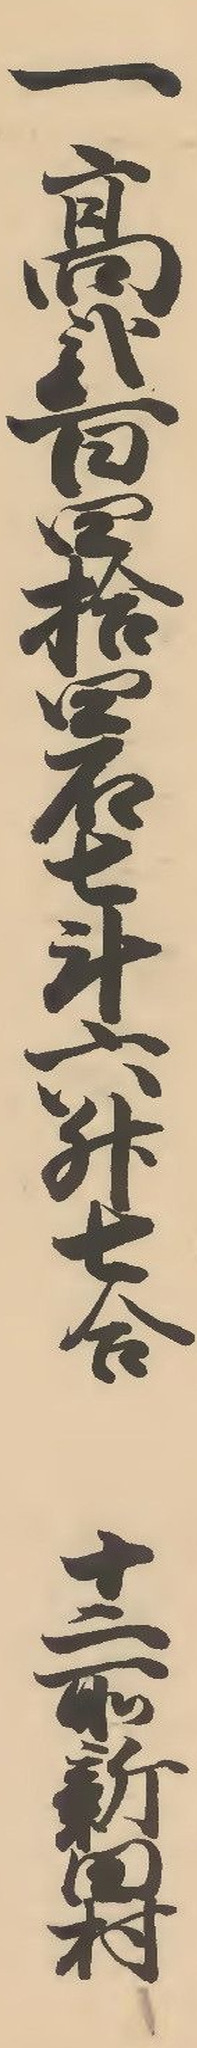一高弐百四拾四石七斗六升七合十二所新田村
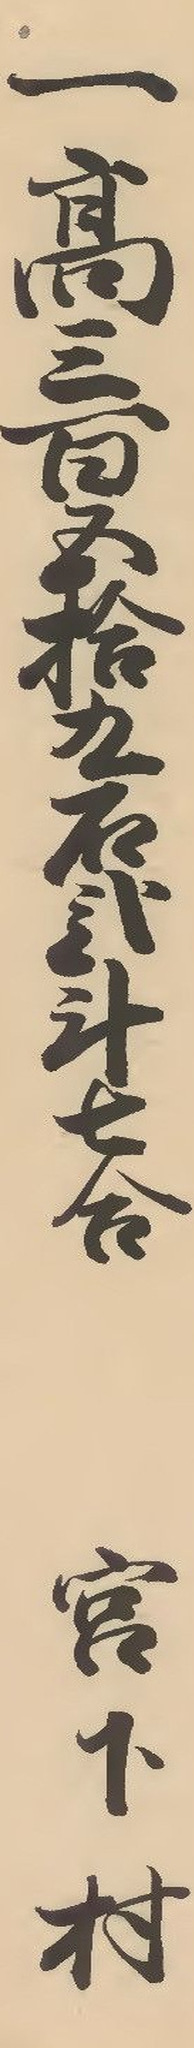一高三百五拾九石弐斗七合宮下村
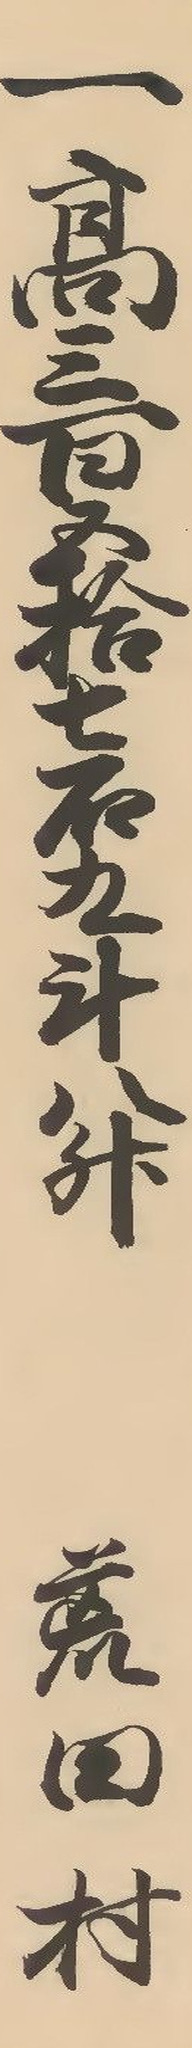一高三百五拾七石九斗八升荒田村
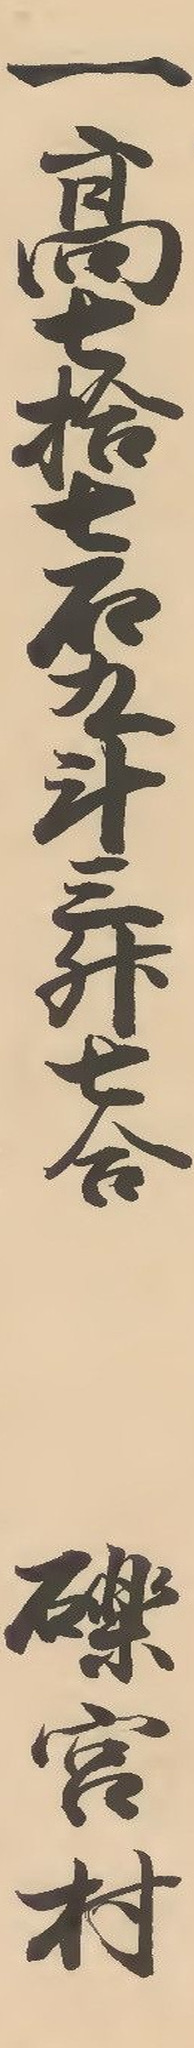一高七拾七石九斗三升七合礫宮村
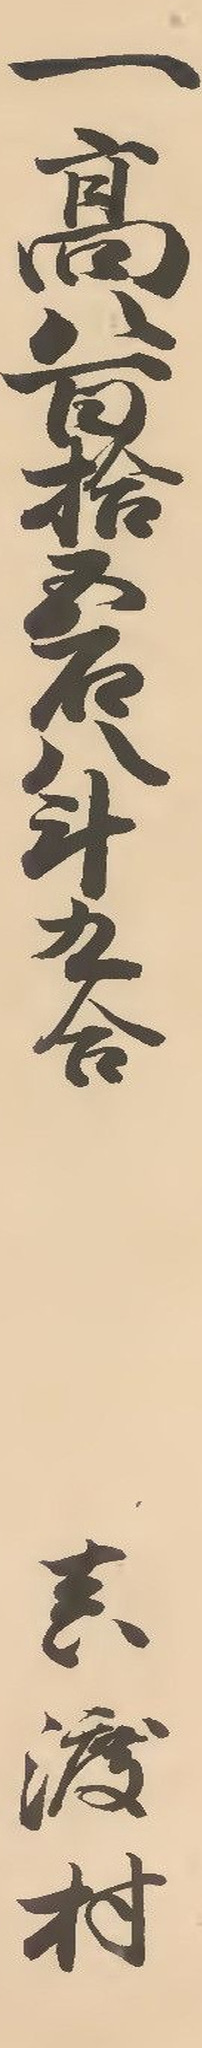一高八百拾五石八斗九合真渡村
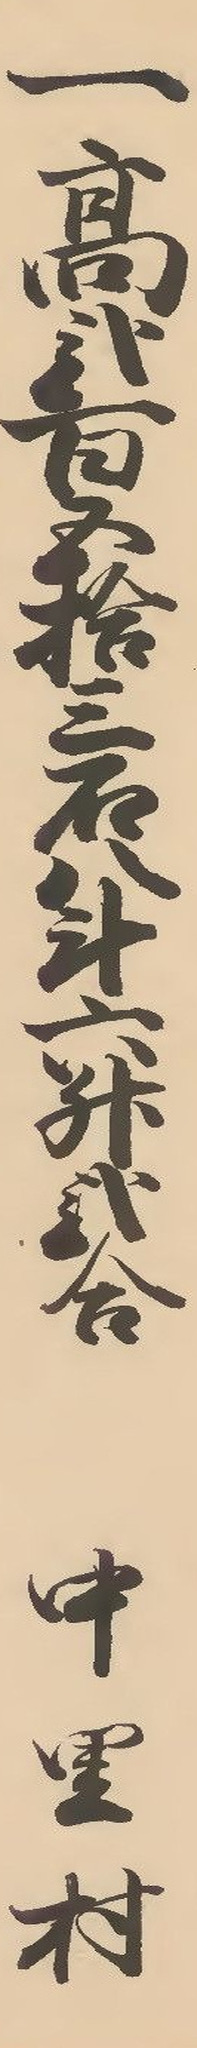一高弐百五拾三石八斗六升弐合中里村
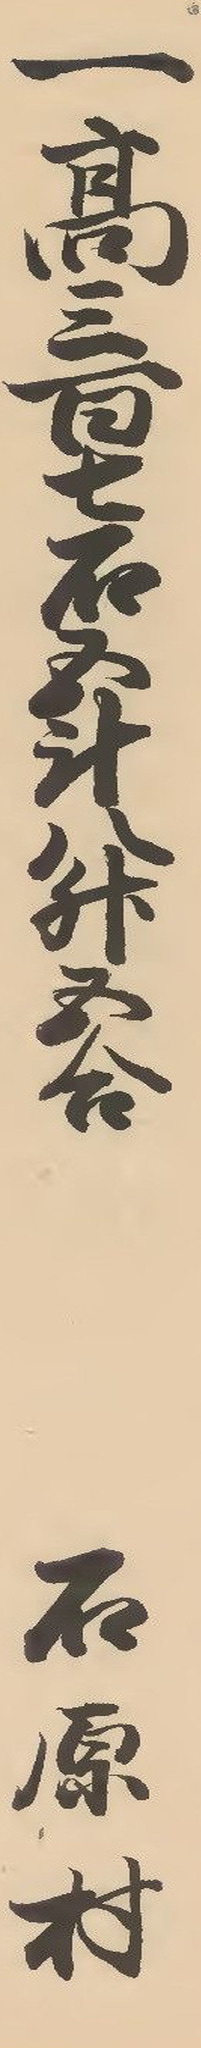一高三百七石五斗八升五合石原村
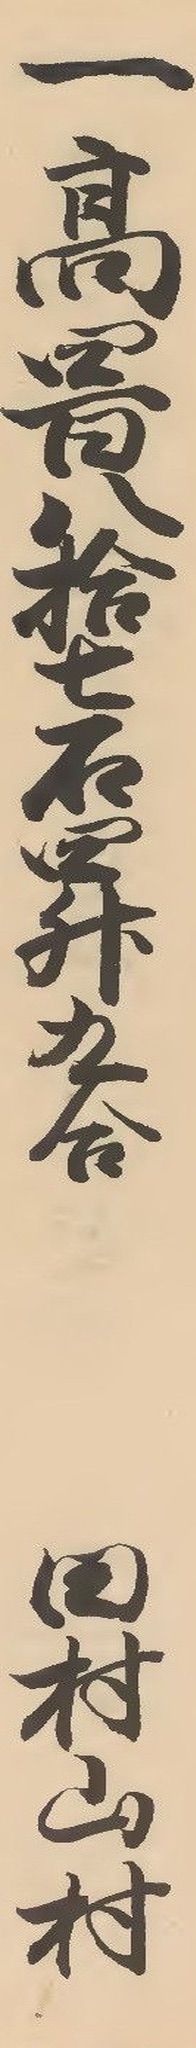一高四百八拾七石四升九合田村山村

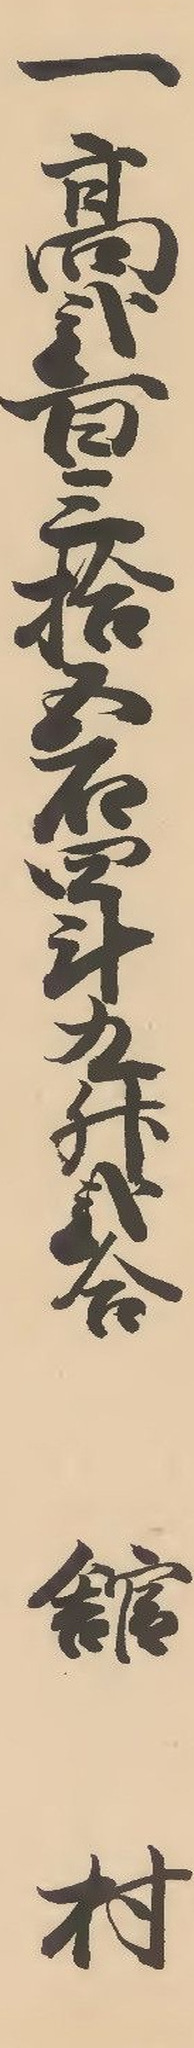一高弐百三拾五石四斗九升弐合館村
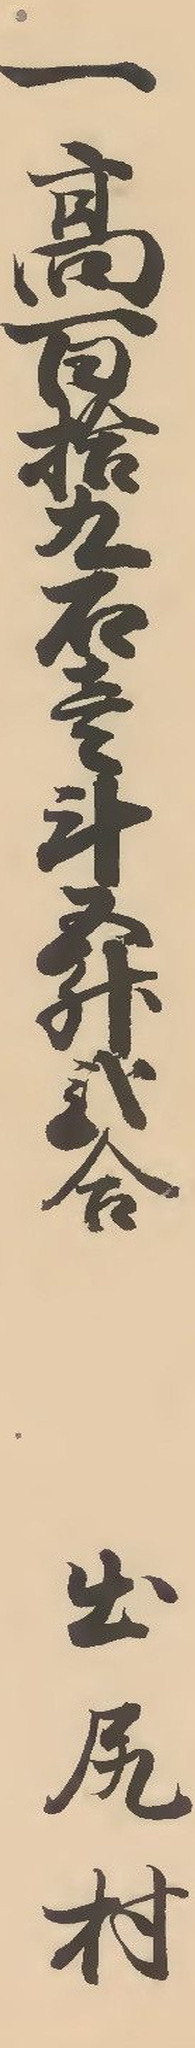一高百拾九石壱斗五升弐合出尻村
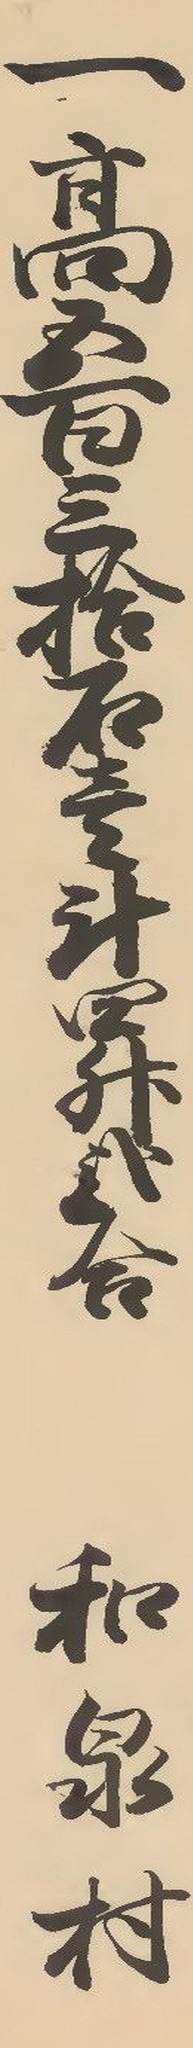一高五百三拾石壱斗四升弐合和泉村
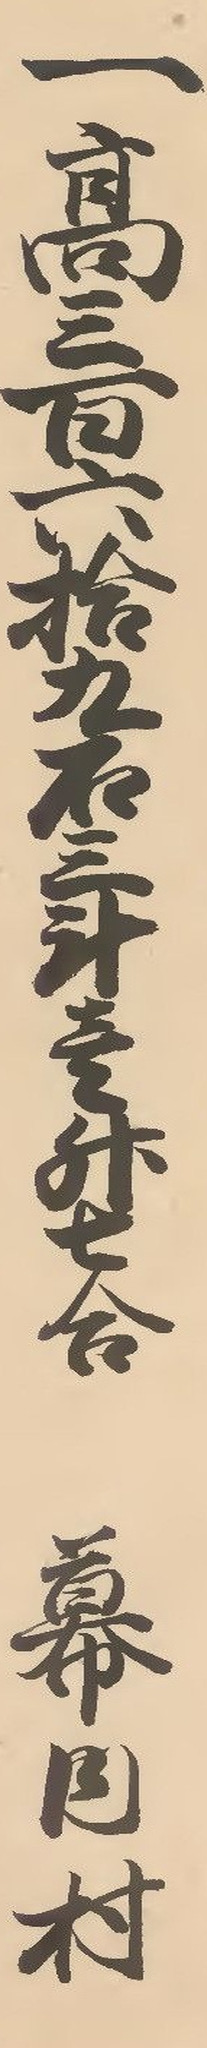一高三百六拾九石三斗壱升七合幕内村
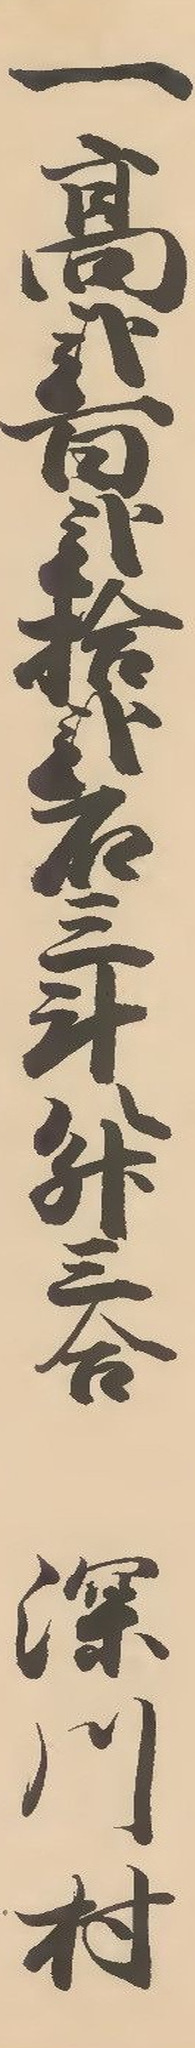一高弐百弐拾弐石三斗八升三合深川村
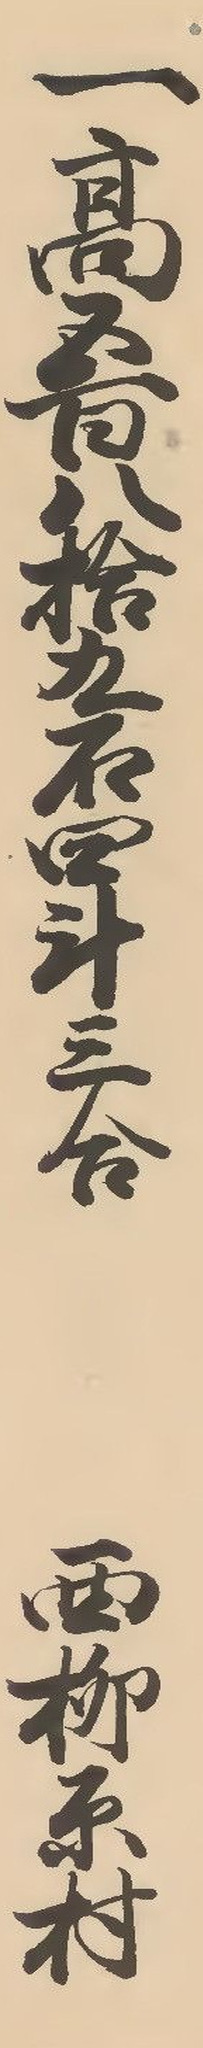一高五百八拾九石四斗三合西柳原村
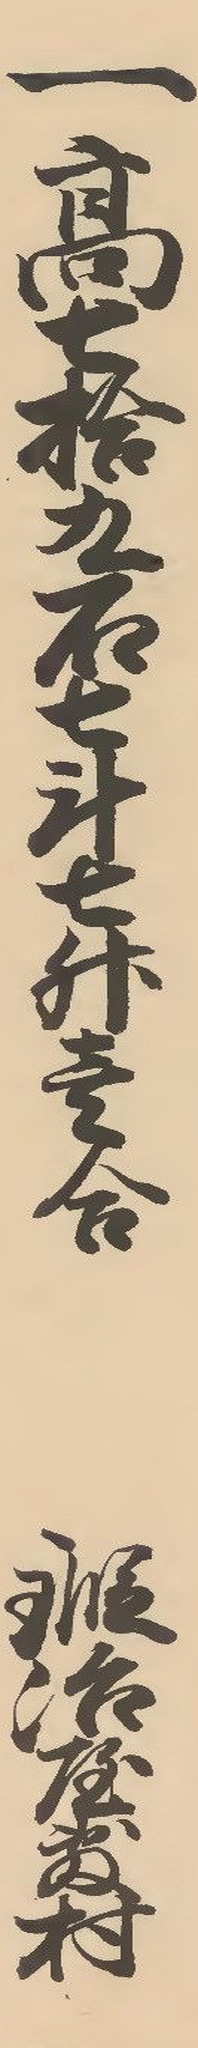一高七拾九石七斗七升壱合鍛冶屋敷村

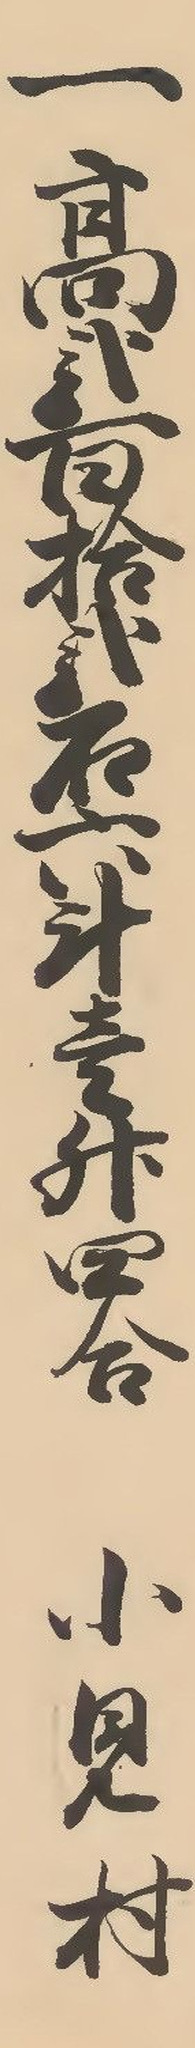一高弐百拾弐石六斗壱升四合小見村
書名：陸奥国郷帳　１
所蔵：国立公文書館 National Archives of Japan
